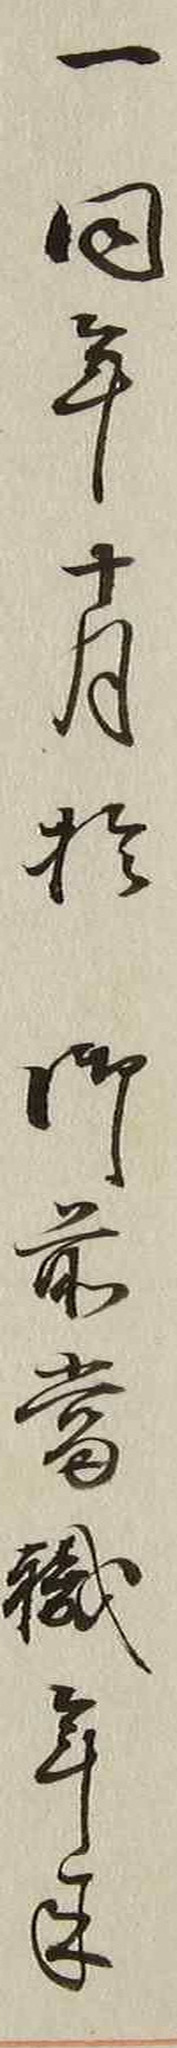一同年十月於御前当職年來
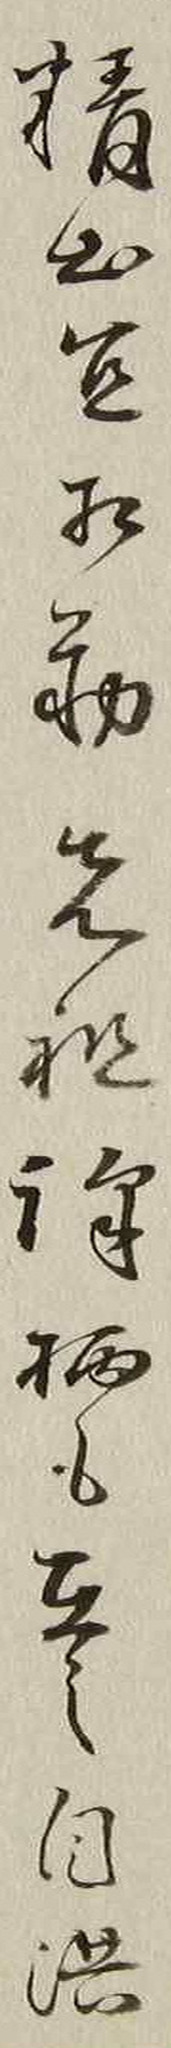精出宜相勤先祖譯柄も有之自洪
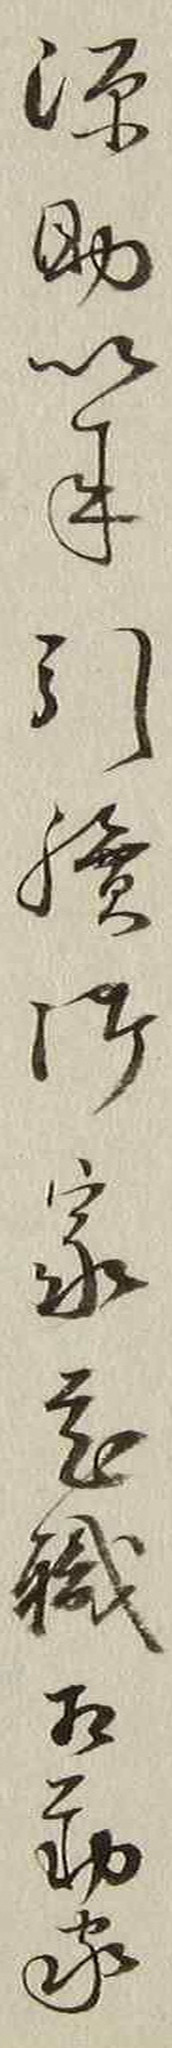源助以來引続御家老職相勤家
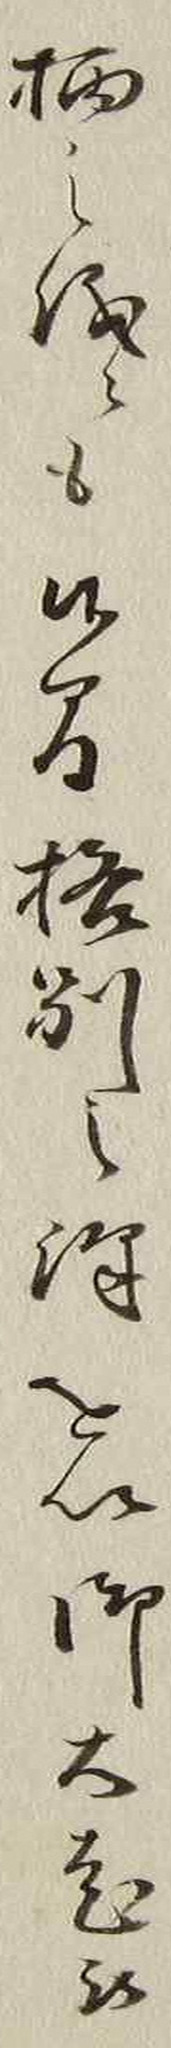柄之儀にも候間格別之譯を以御大老被
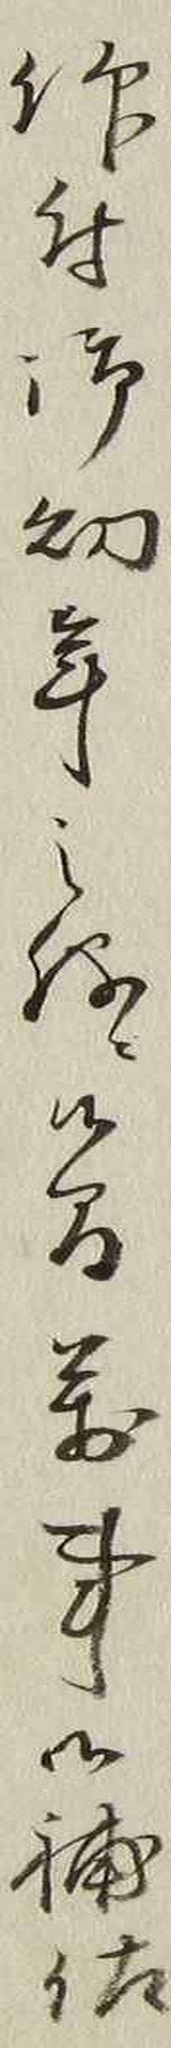仰付御幼年之儀に候間万事御補佐
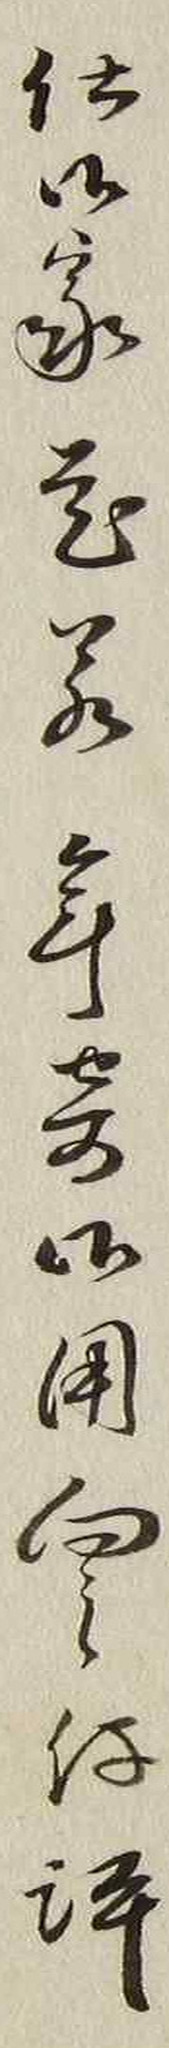仕御家老若年寄御用向之儀評
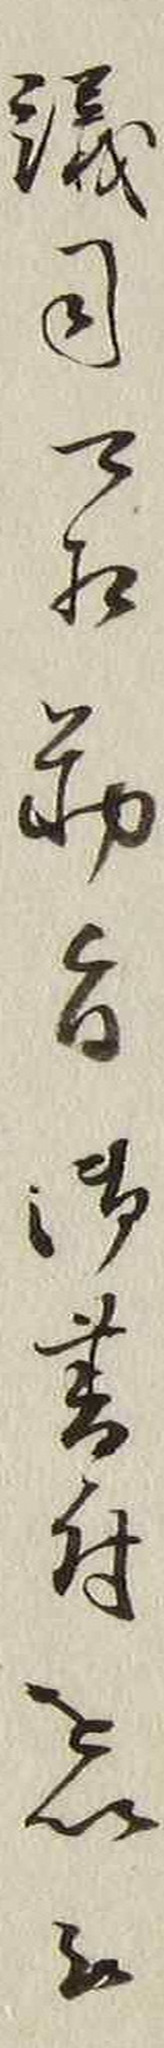議司可相勤旨御書付を以被
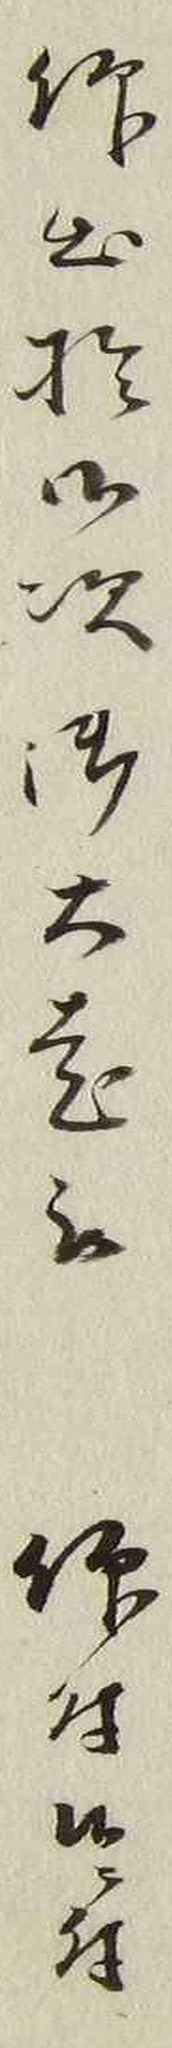仰出於御次御大老被仰付候に付
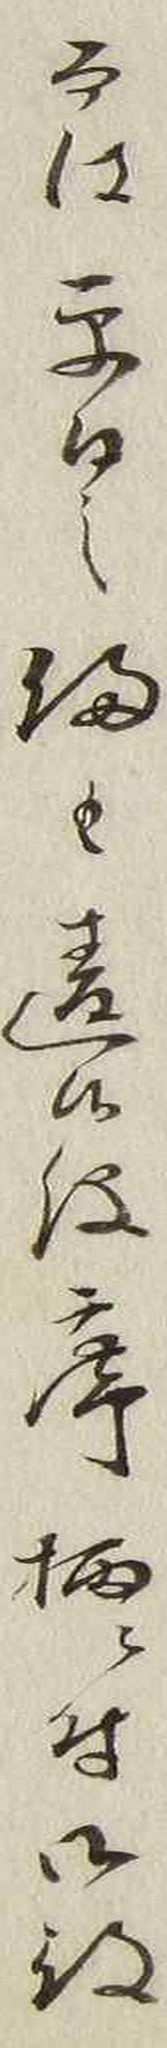而は平日之備も違候儀席柄に付御役
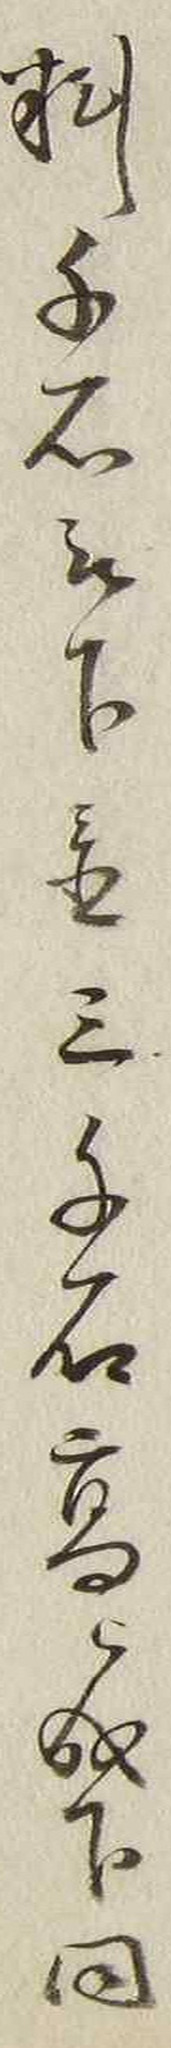料千石被下置三千石高被成下同

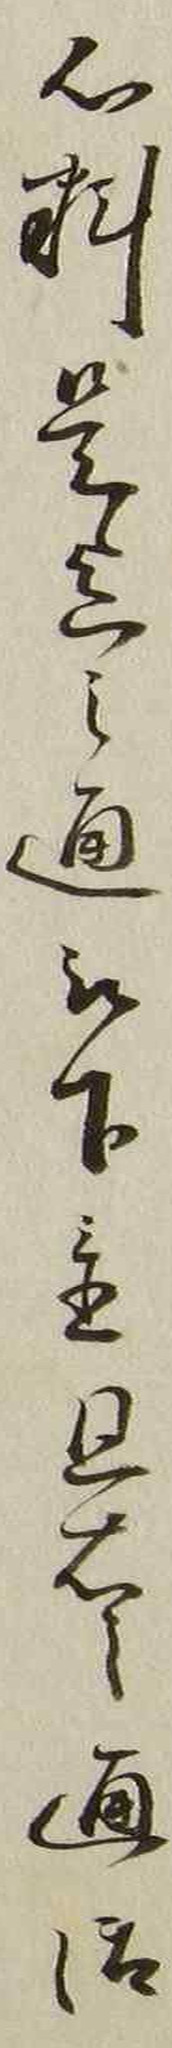心料是迄之通被下置旦右之通御
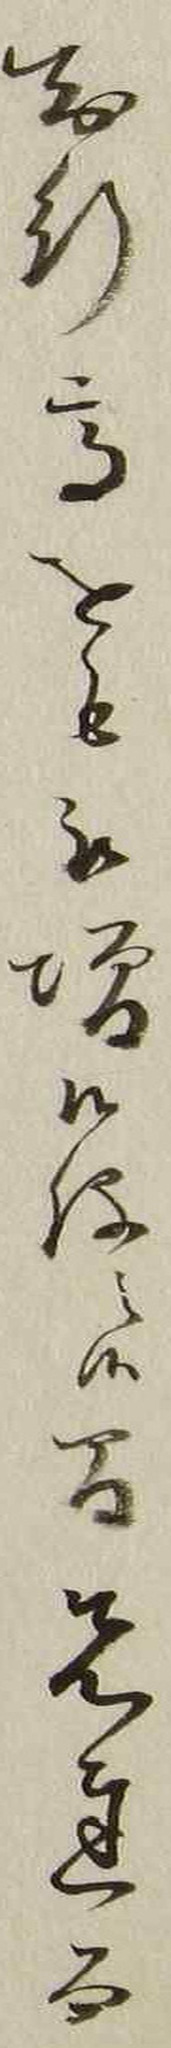知行高を被増候儀に候間先達而
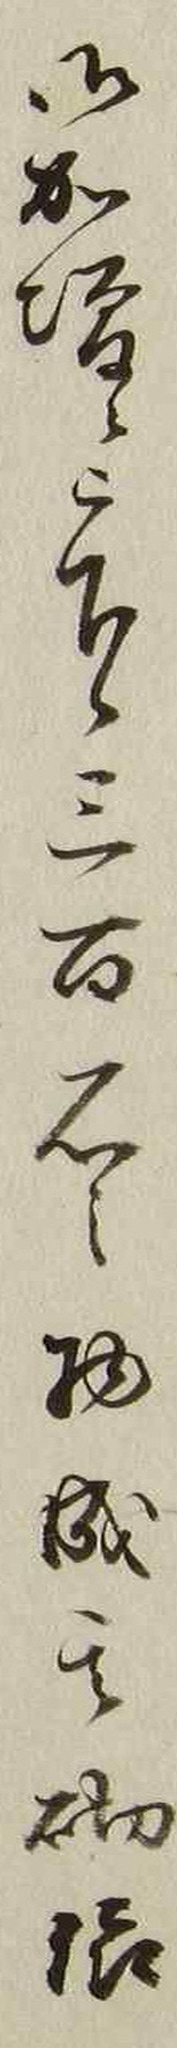御加増被下候三百石之物成其砌依
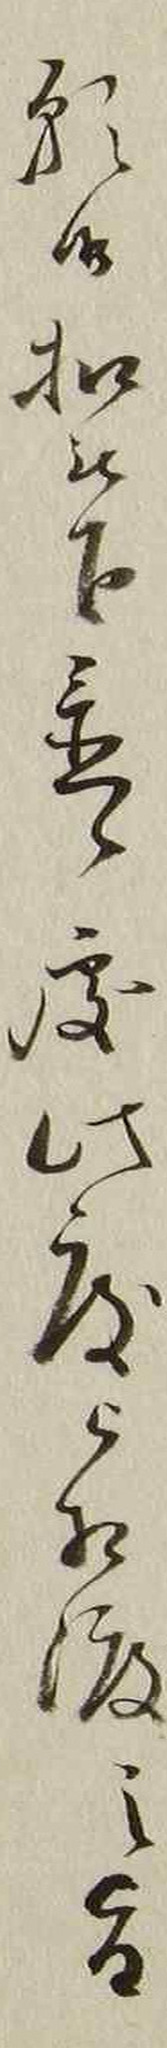願御扣被下置候処此度被相渡之旨
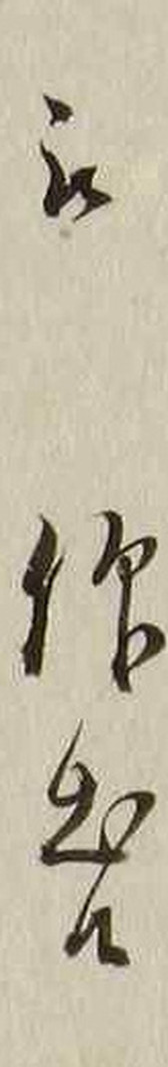被仰出候
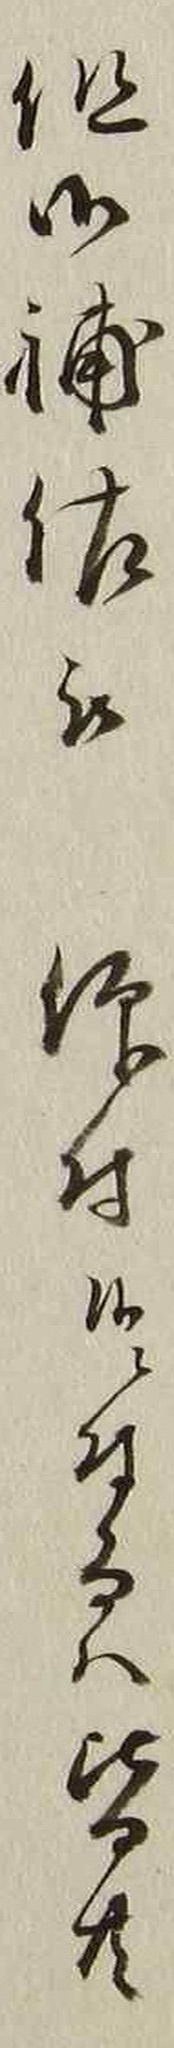但御補佐被仰付候に付而は皆共
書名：諸士系譜　巻之159　な之部1
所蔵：会津若松市立会津図書館
